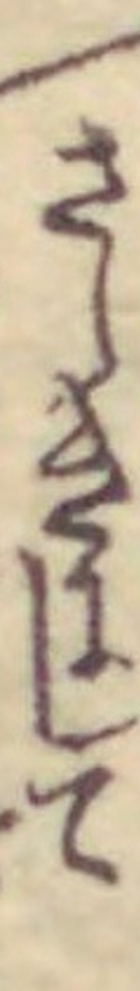さしきにして
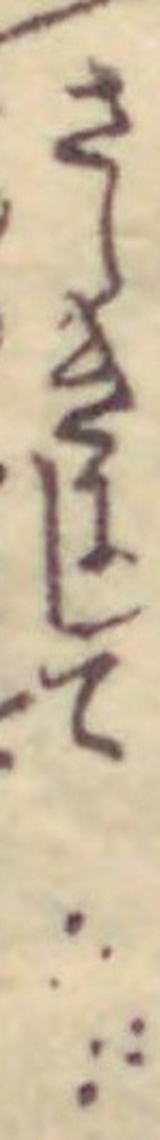さしきにして
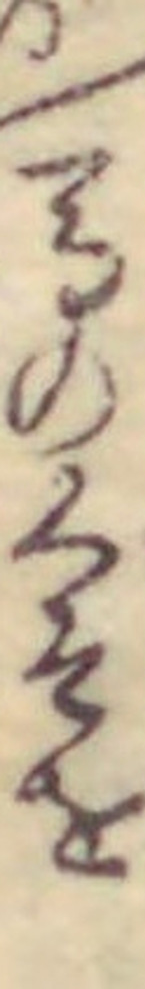馬のくそを
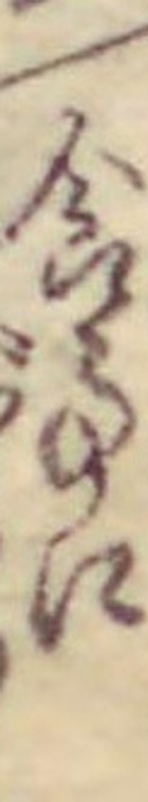食事に
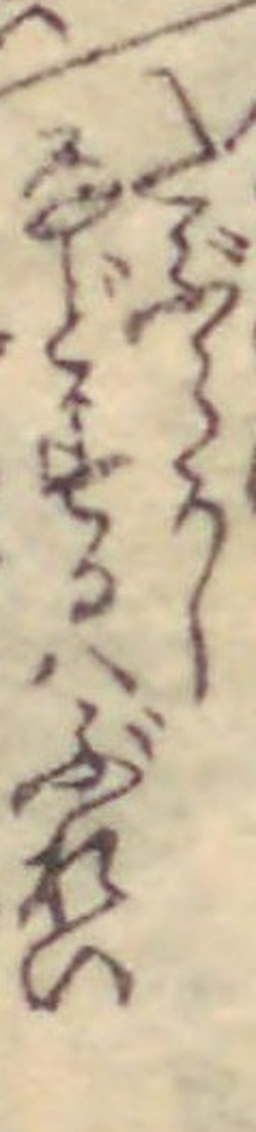などするはぶれい
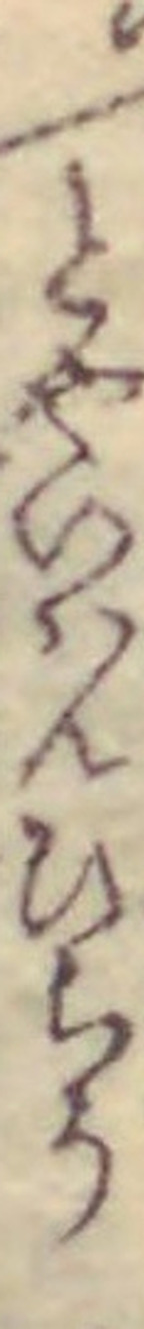とやいはんひう
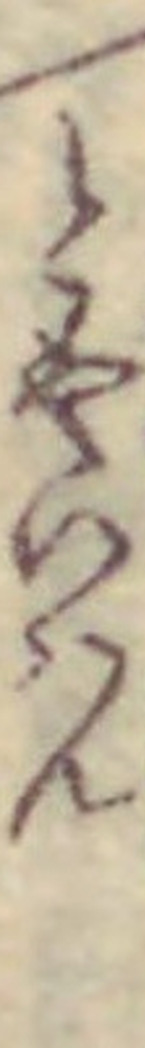とやいはん
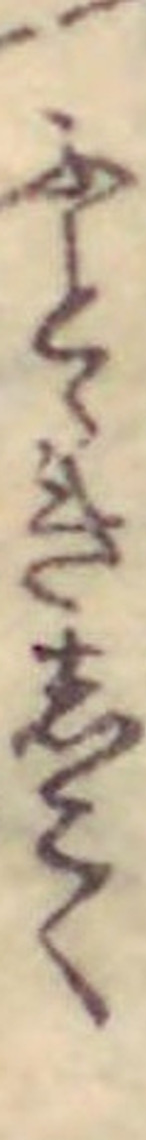ふとゝきしこく
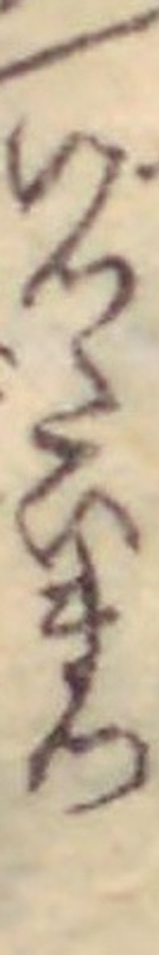いつたいまつ
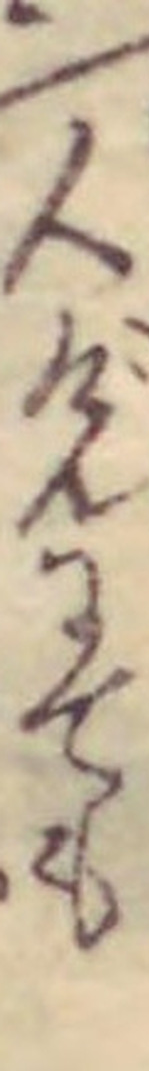人げんにても
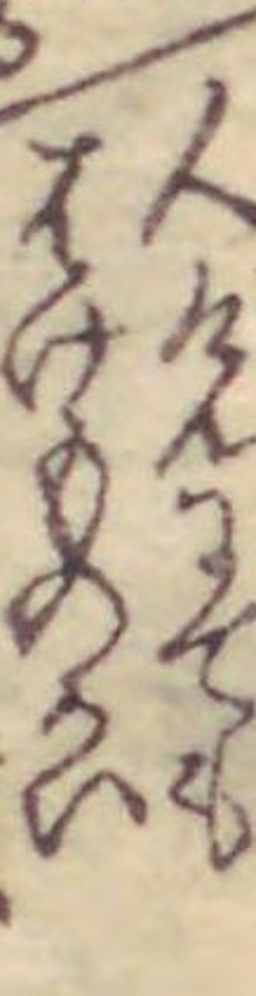はけものかい
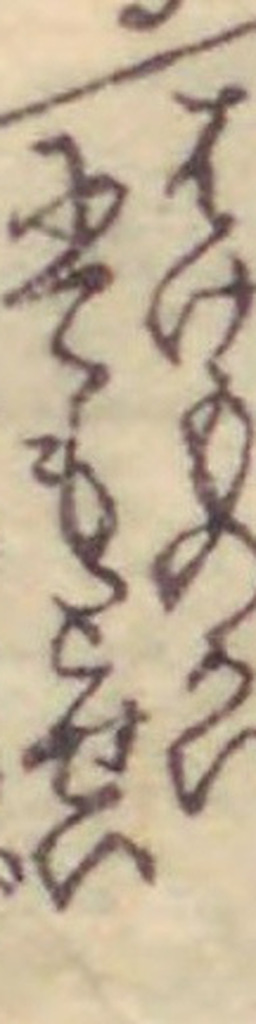にてもとせい
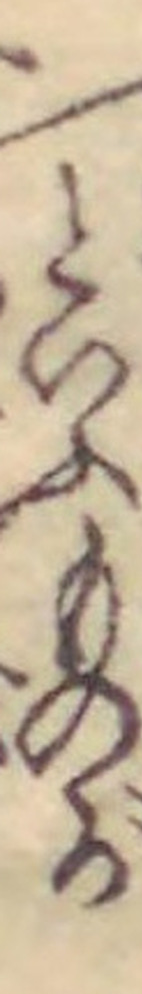といふものが
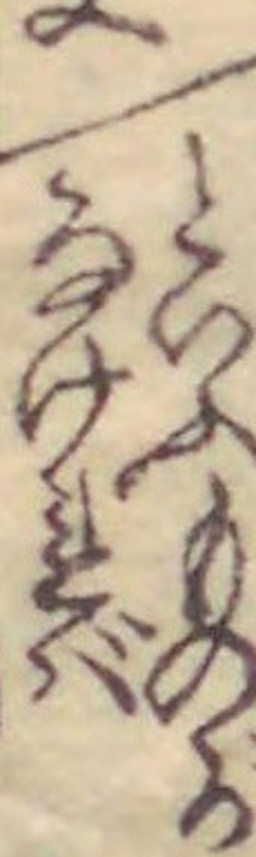なければ
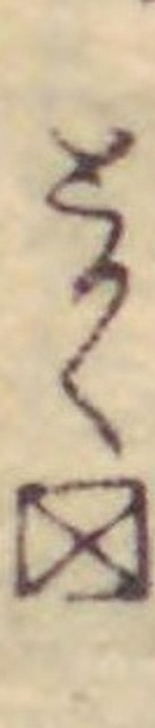とかく〿

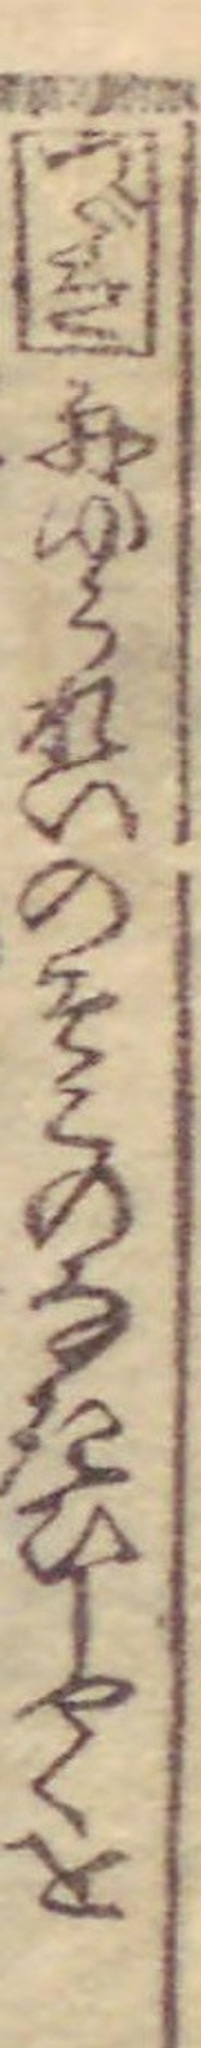つゞき舟ゆうれいのそこのなきひしやくを
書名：化物世帯氣質
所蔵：国立国会図書館 National Diet Library, JAPAN
